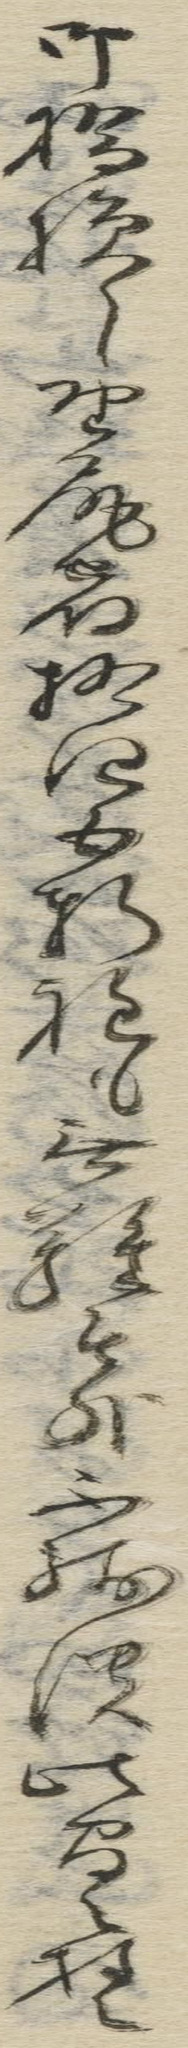御橋損し野尻宿拾四五軒程も無難其外不残潰此間之村々
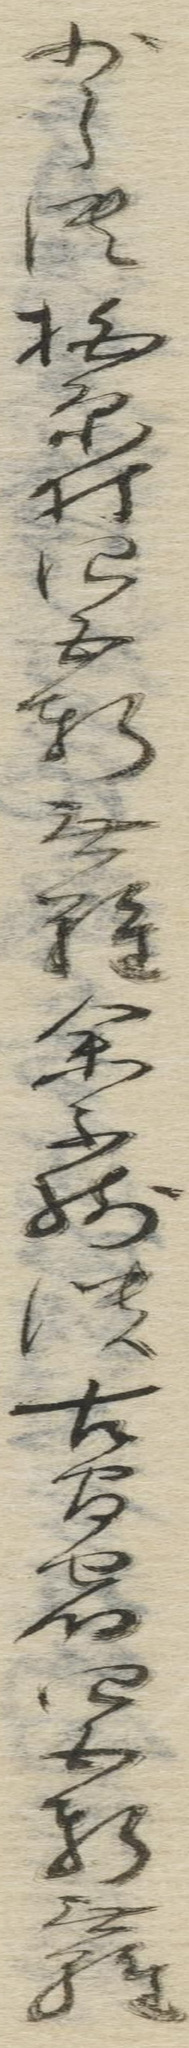少し潰柏原村四五軒無難余不残潰古間宿四五軒無難
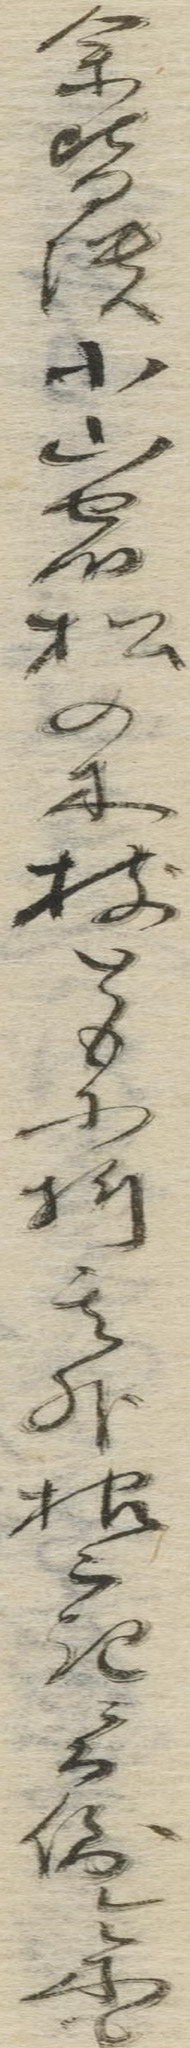余皆潰小山宿松の木枝ともに折其の外根こき二而倒レし等も
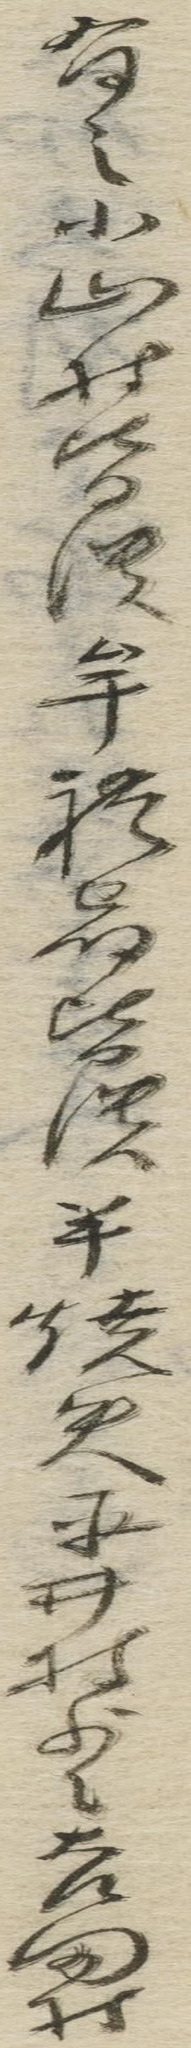有之小止村皆潰牟礼宿皆潰半焼失平井村少し吉田村
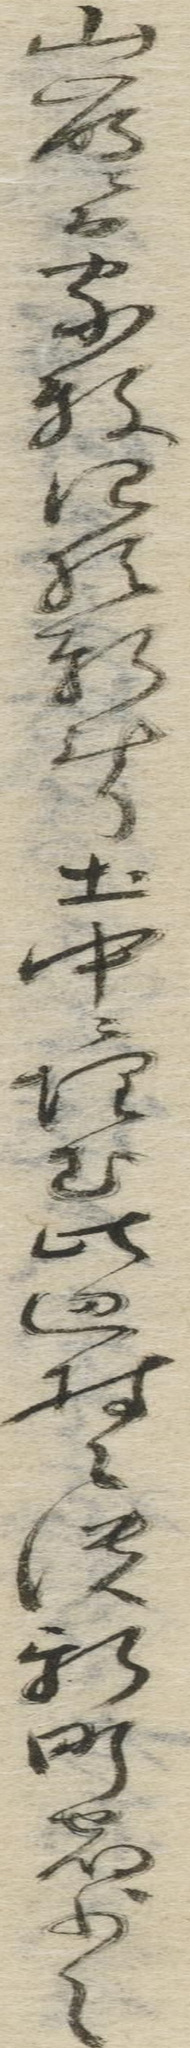山崩二而家数四拾軒計り土中二埋む此の辺村々潰新町宿少し
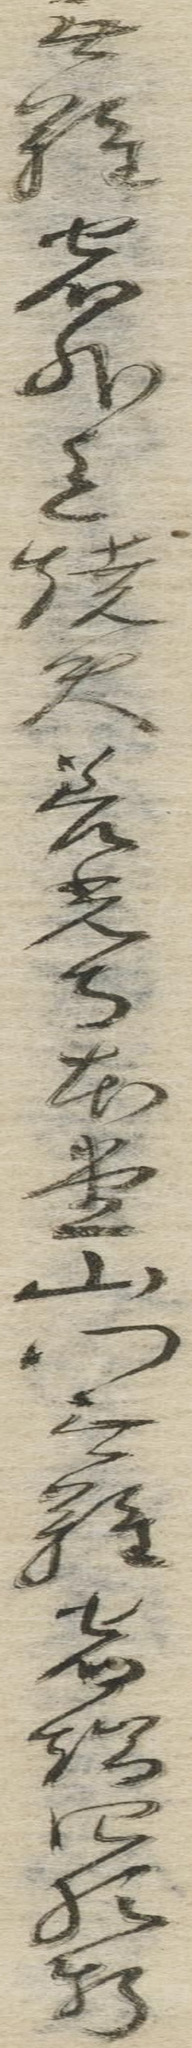無難宿外迄焼失善光寺本堂山門無難宿端四拾軒
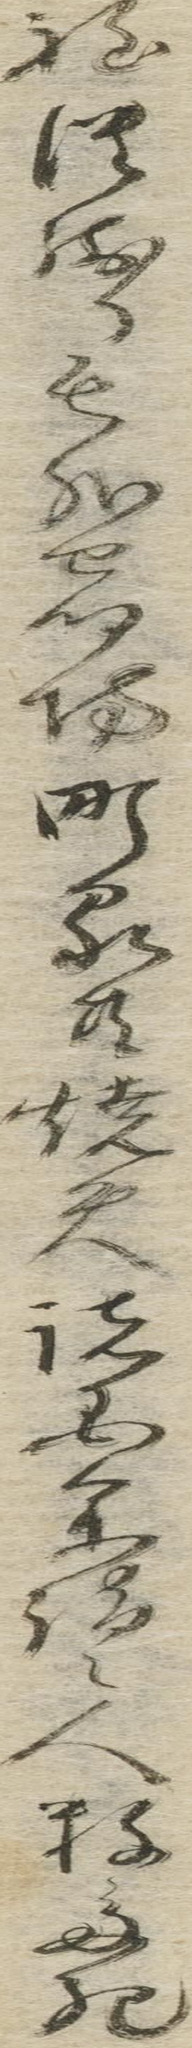程潰残り其外宿場町家共焼失諸国参詣之人数多死
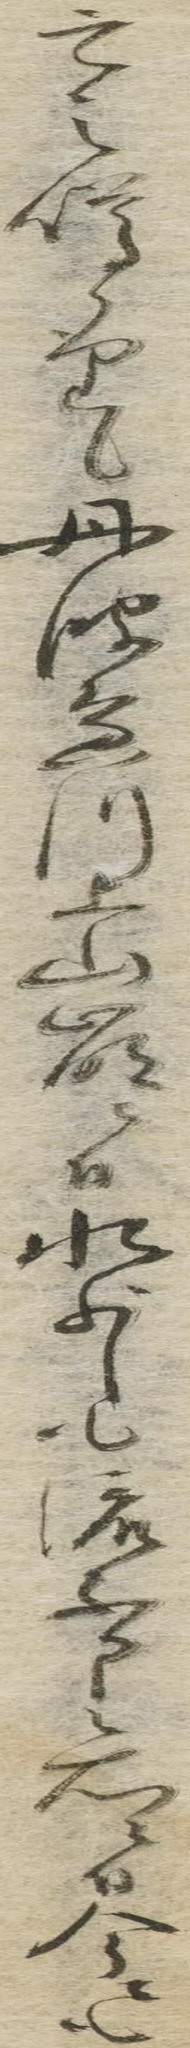亡之噂に御坐候候丹波島川上山崩二而水少しも流不申候右二付今二も
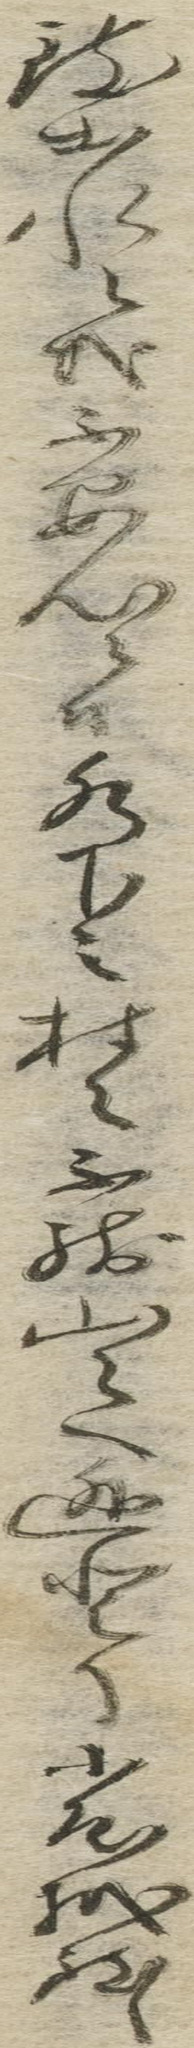致出水候哉不安心二付水下之村々不残山々へ逃登り小屋掛致し
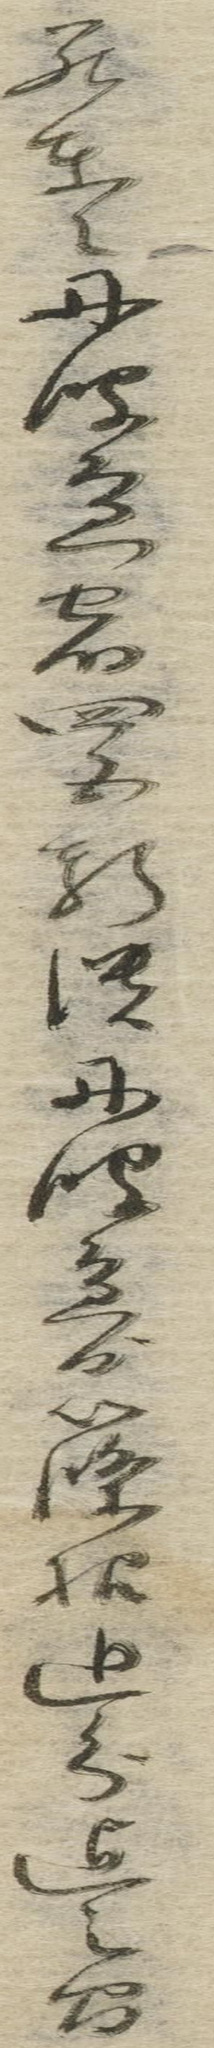罷在候丹波島宿四五軒潰丹波島ゟ篠根追分迄之間

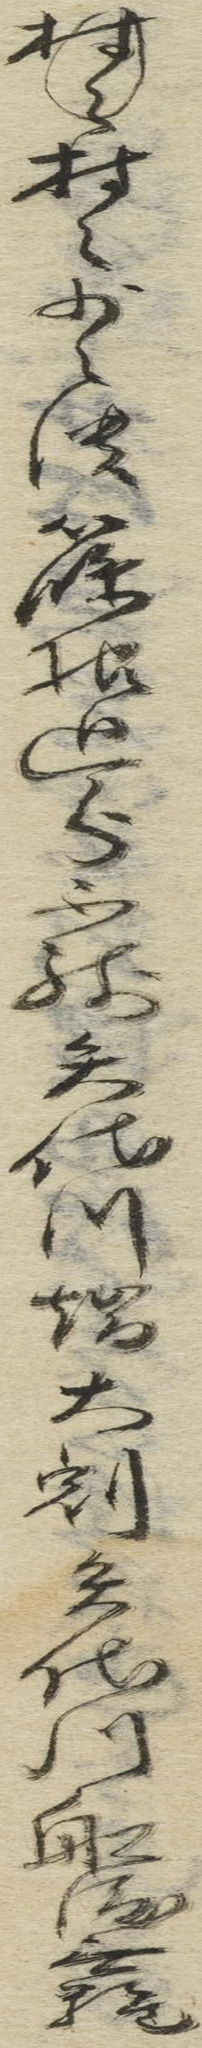村之村々少し潰篠根追分不残矢代川端大割矢代川船渡無難
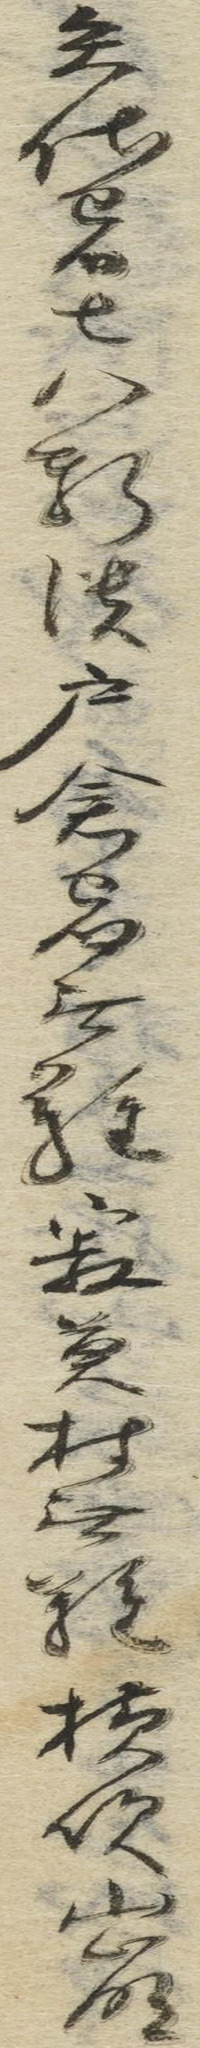矢代宿七八軒潰戸倉宿無難寂莫村無難横吹山崩
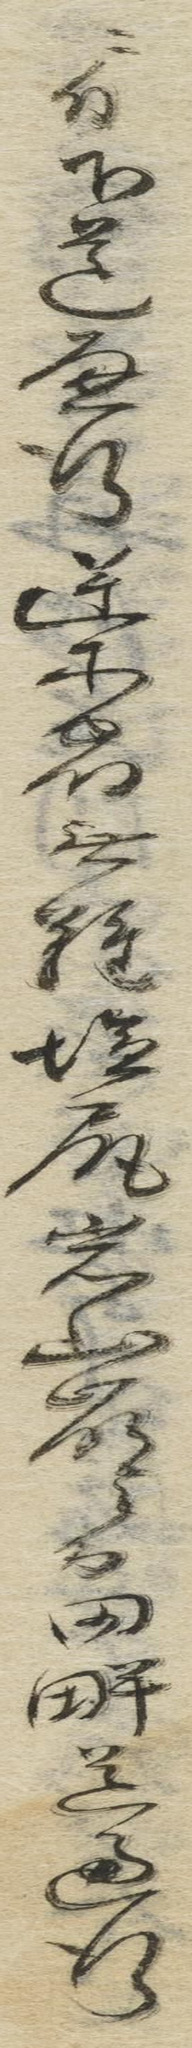二付下迄通行逆木宿無難塩尻岩山崩二而田畔送通行
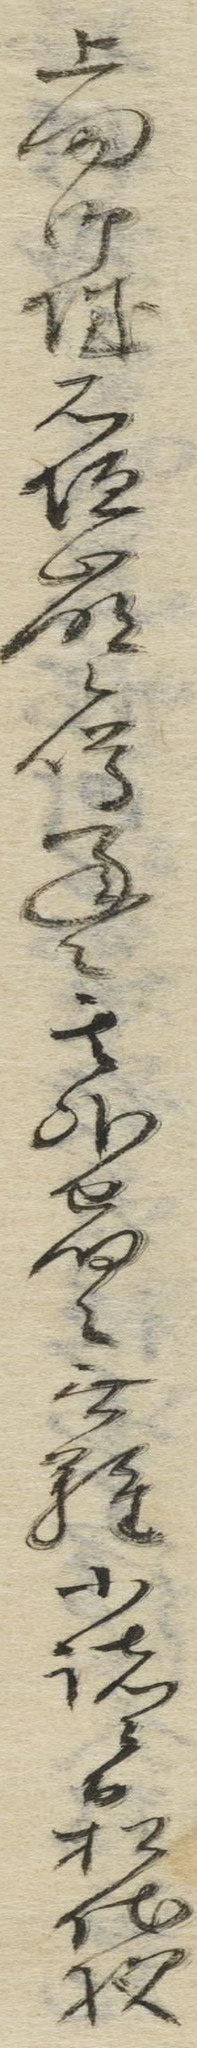上田御城石垣崩候噂通候其外宿々無難小諸二而松代様
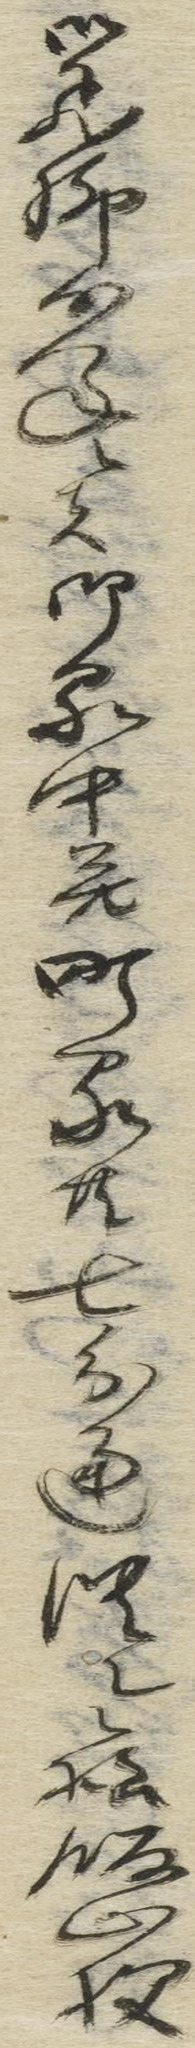御飛脚二承二は御家中并町家共七分通潰レ候様飯山様
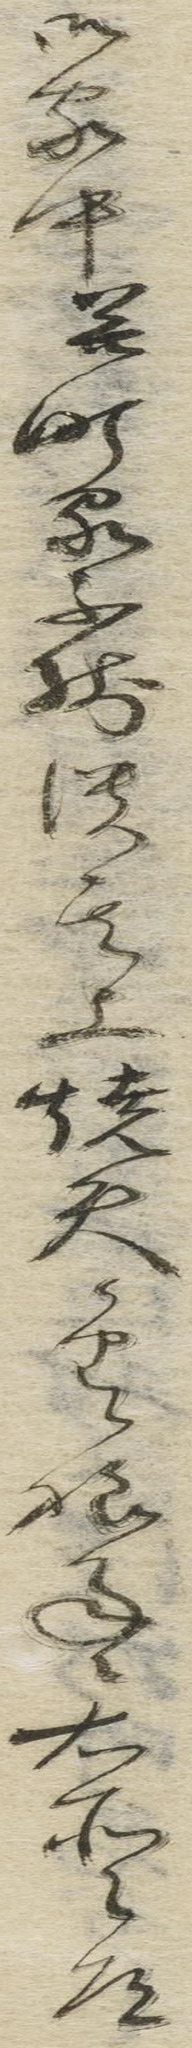御家中并町家不残潰其上焼失候由候様子二右所々道
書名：弘化丁未天變日記
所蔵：東京大学地震研究所図書室 Earthquake Research Institute Library, The University of Tokyo, JAPAN
